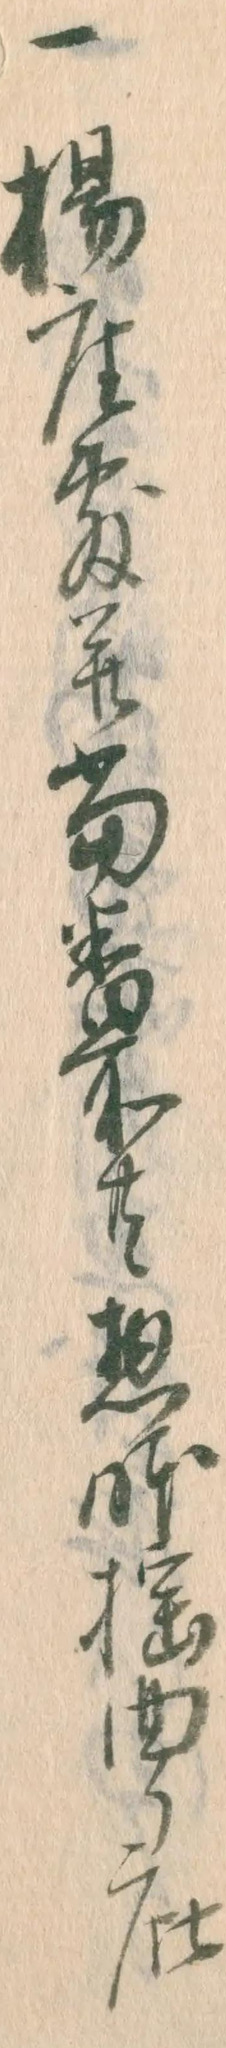一揚座敷幷当番所共惣体揺曲り庇
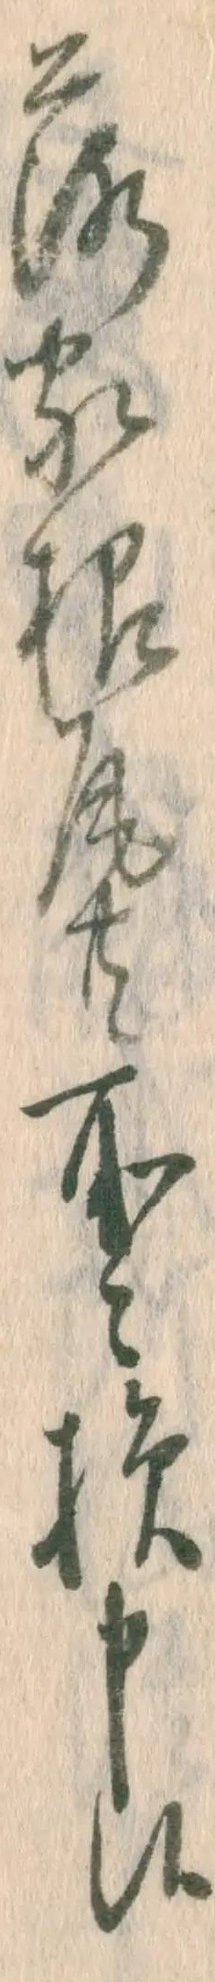落家根瓦共所〻損申候
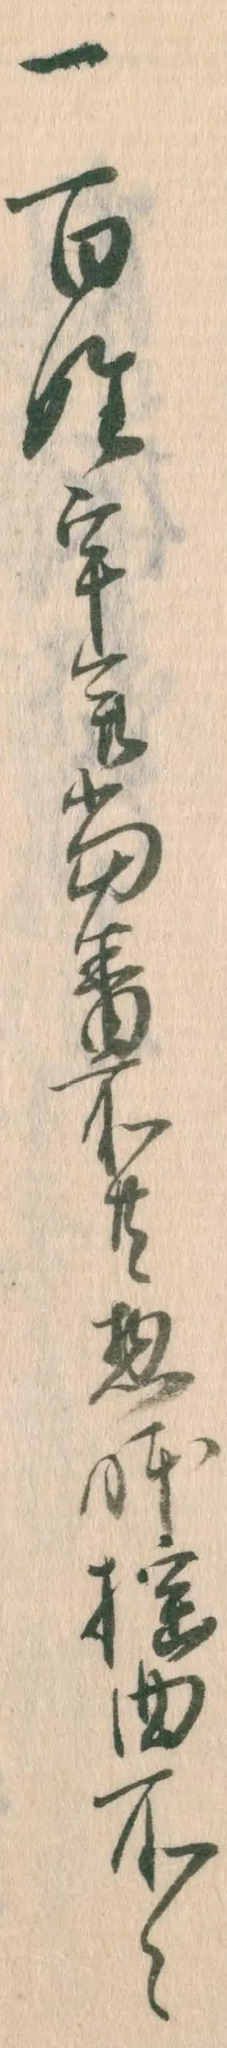一百姓牢幷当番所共惣体揺曲所〻
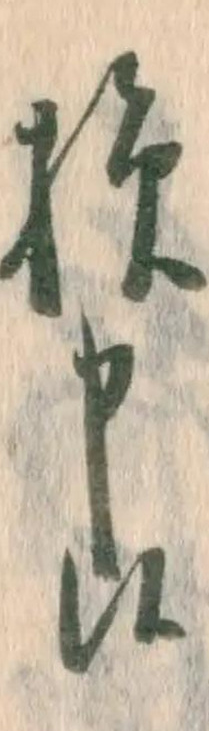損申候
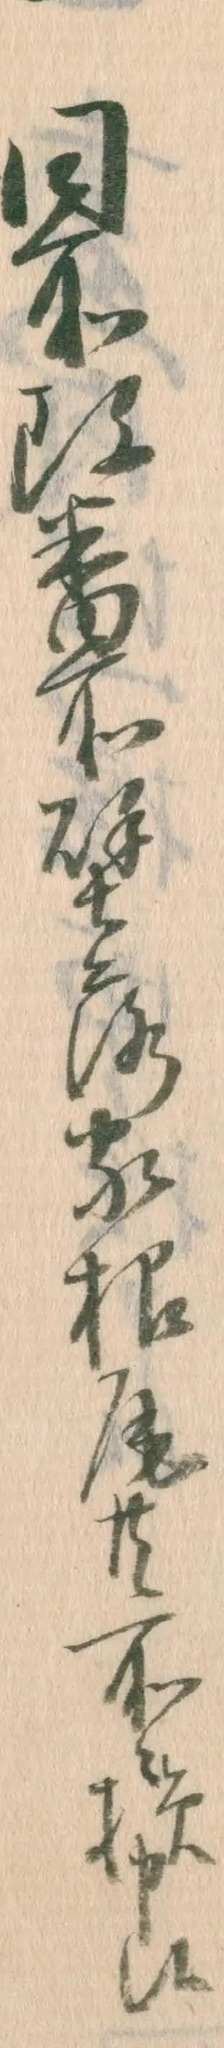一同所改番所壁落家根瓦共所〻損申候
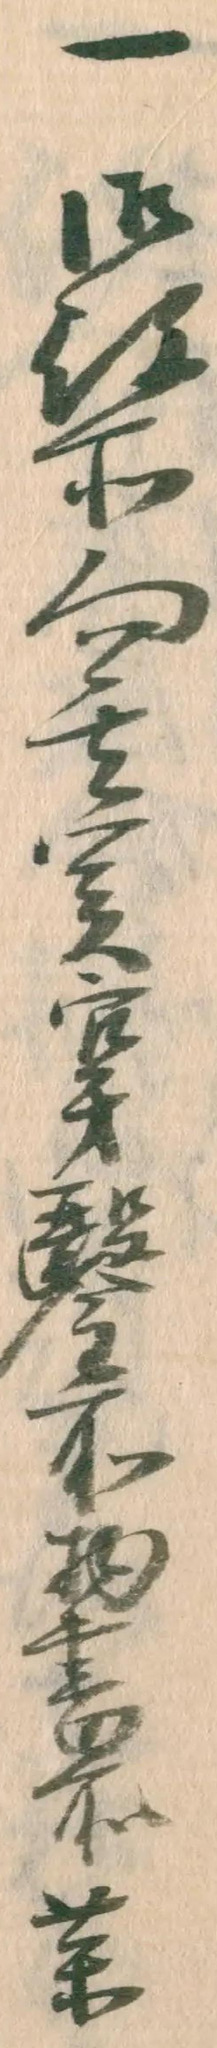一御役所向玄関穿鑿所物書所薬
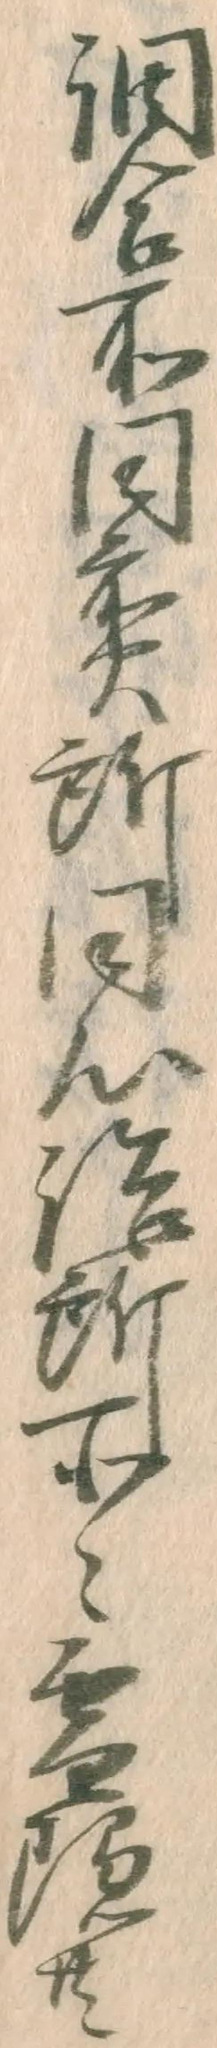調合所同煎所同心詰所所〻雪隠共
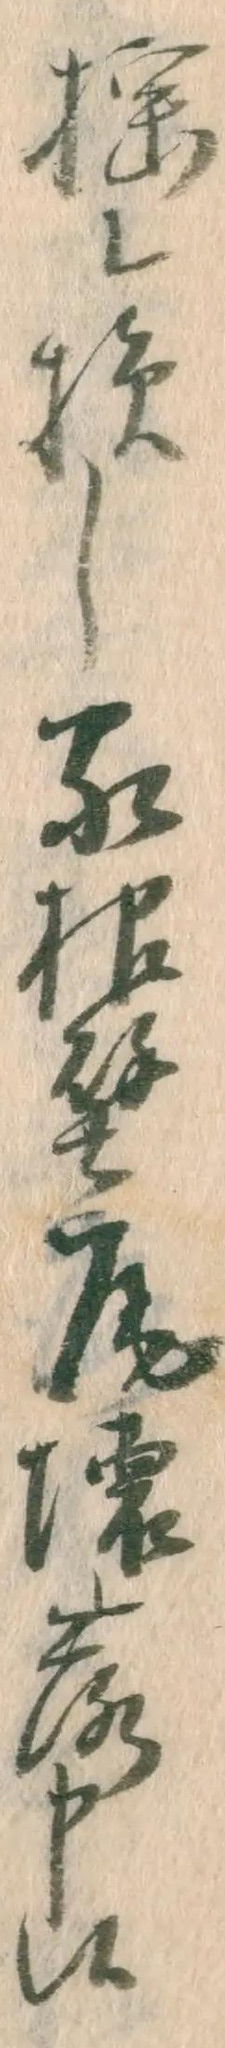揺レ損し家根壁瓦壊落申候
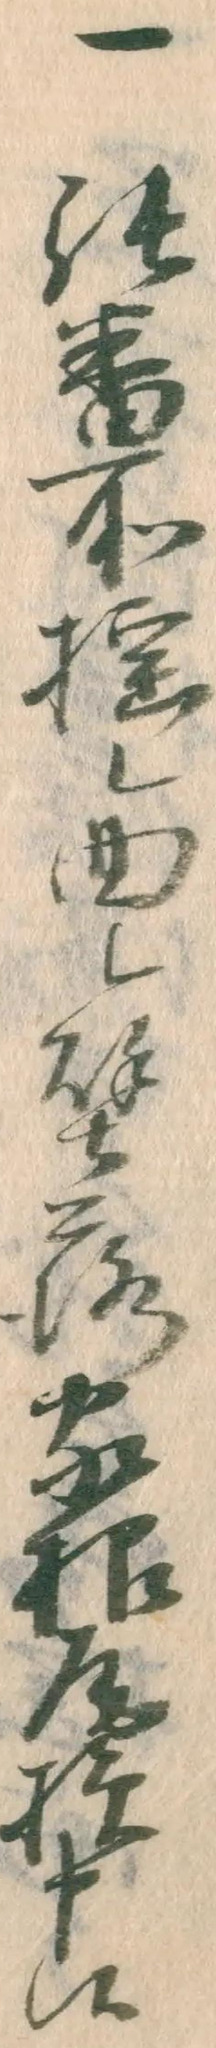一張番所揺レ曲レ壁落家根瓦損申候
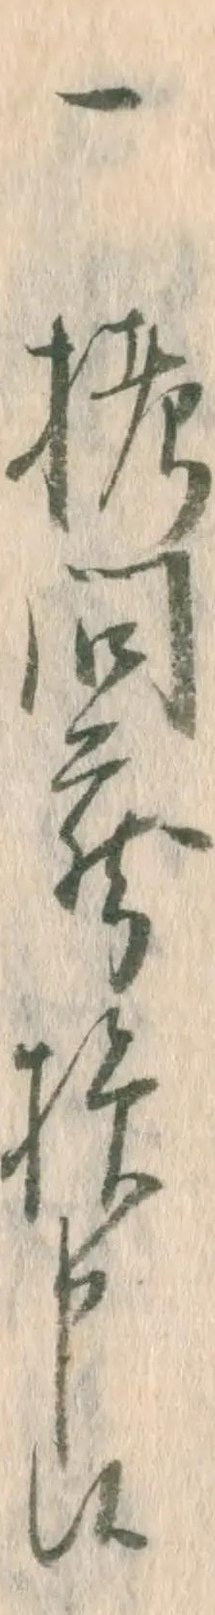一拷問蔵損申候
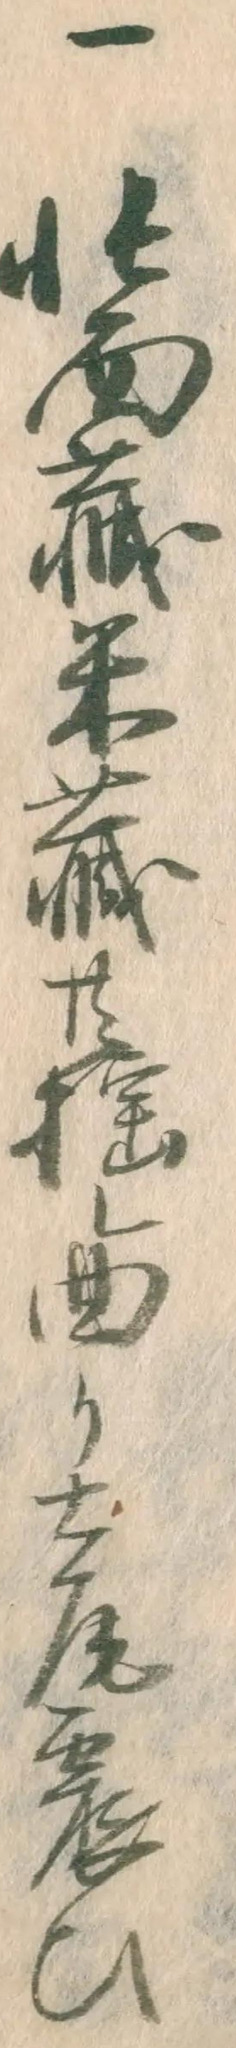一帳面蔵米蔵共揺レ曲り土瓦震ひ

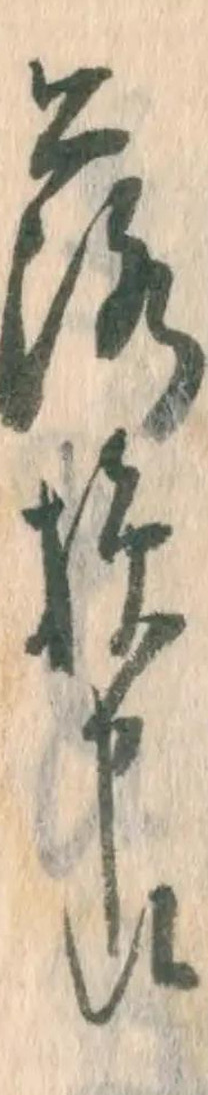落損申候
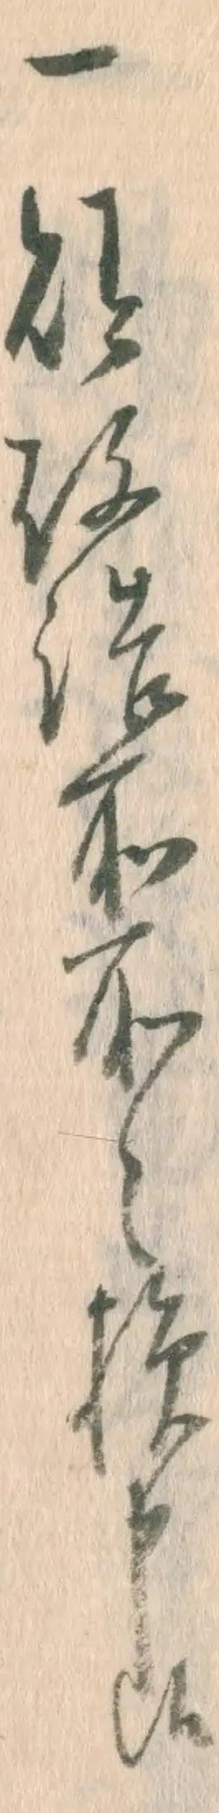一賄役詰所所〻損申候
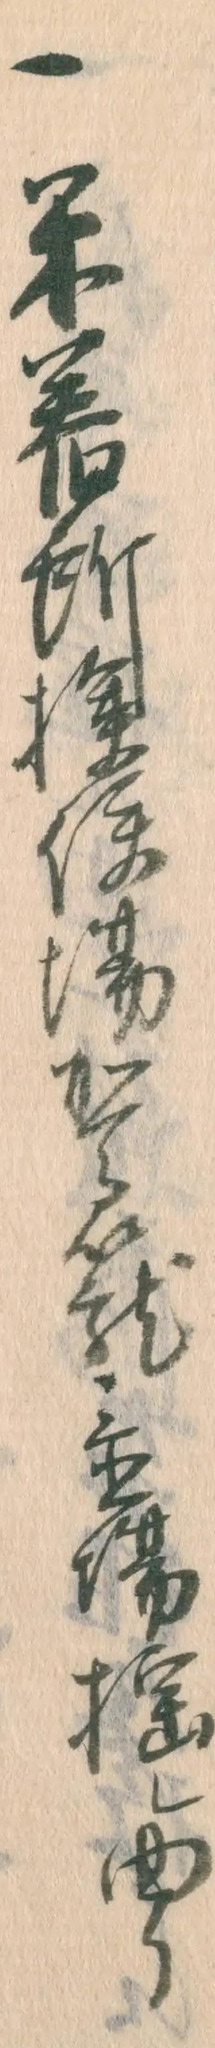一米舂所検使場駕籠置場揺レ曲り
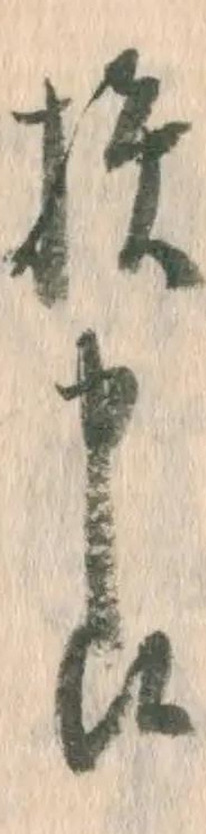損申候
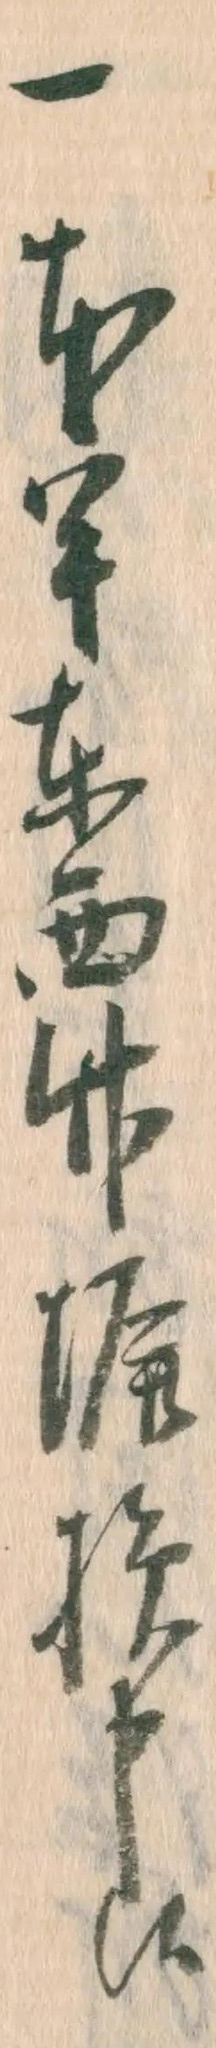一本牢東西竹塀損申候
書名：七十冊物類集 71巻. [44] 四十三 牢屋敷御普請御修覆地震ニ付骨折候牢屋掛御褒美之部
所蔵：国立国会図書館 National Diet Library, JAPAN
